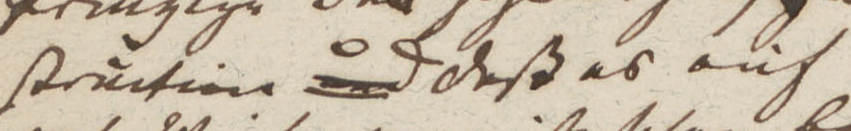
struction und dass es auf
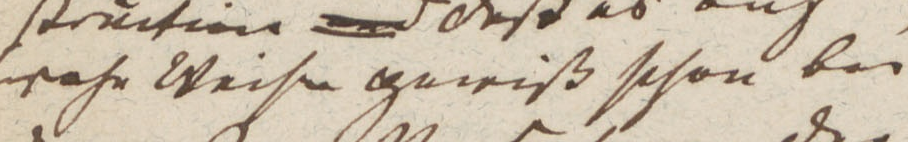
rohe Weise gewiss schon bei
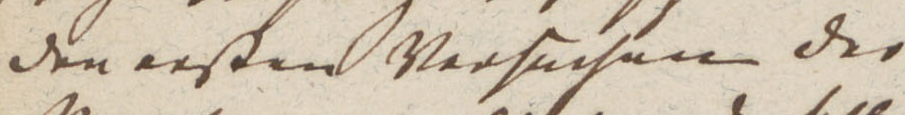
den ersten Versuchen der
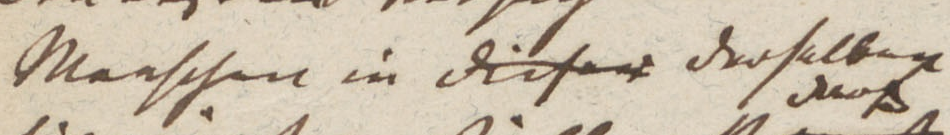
Menschen in dieser derselben
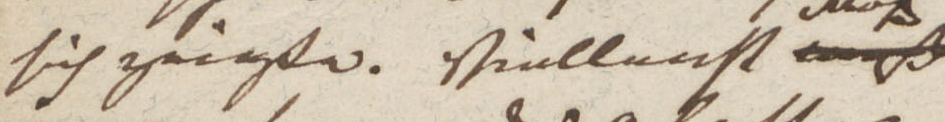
sich zeigte. Vielleicht muss
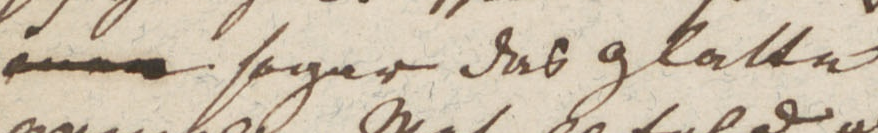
man sogar das glatte
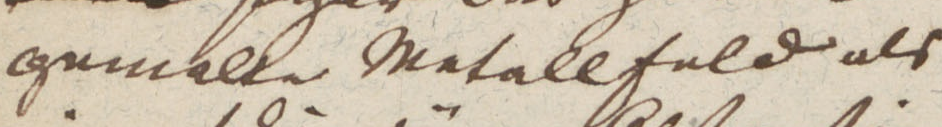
gemalte Metallfeld als
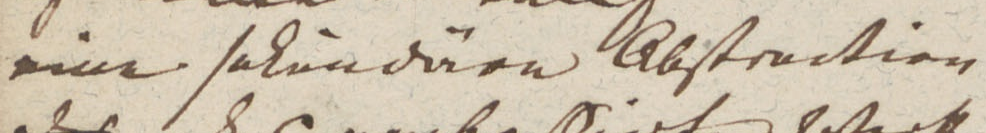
eine sekundäre Abstraction
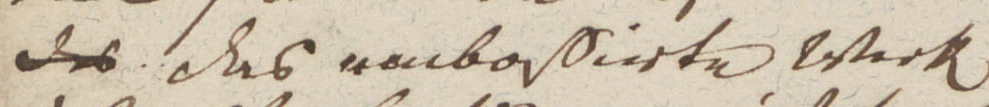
ds das symbolisirte Werk
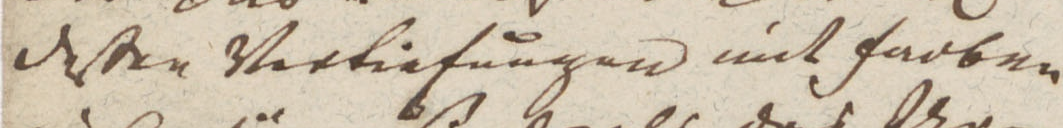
dessen Vertiefungen mit Farben
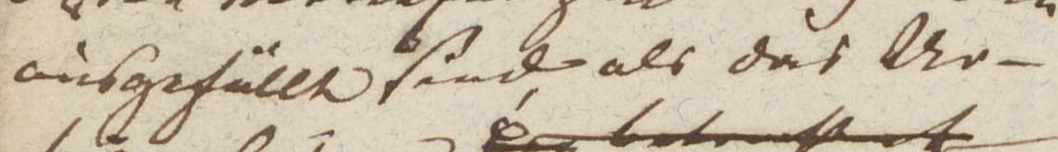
ausgefüllt sind, als das Ur-
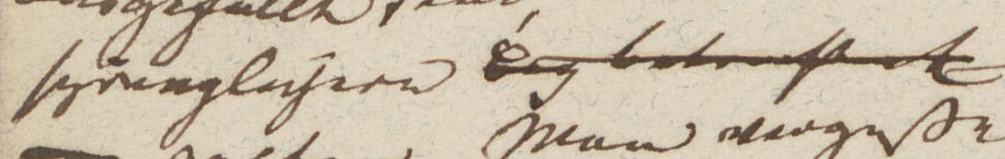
sprünglichere bez betrachtet
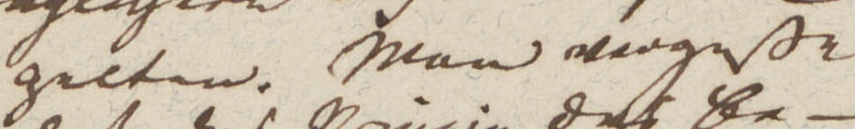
gelten. Man vergesse
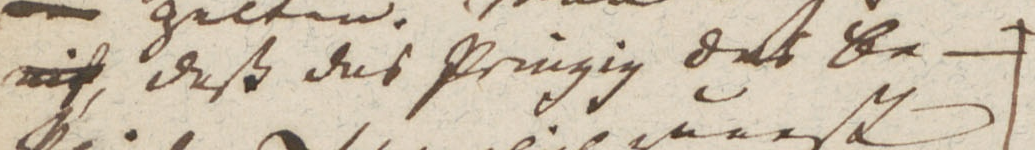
ni, dass das Prinzip des Be-
